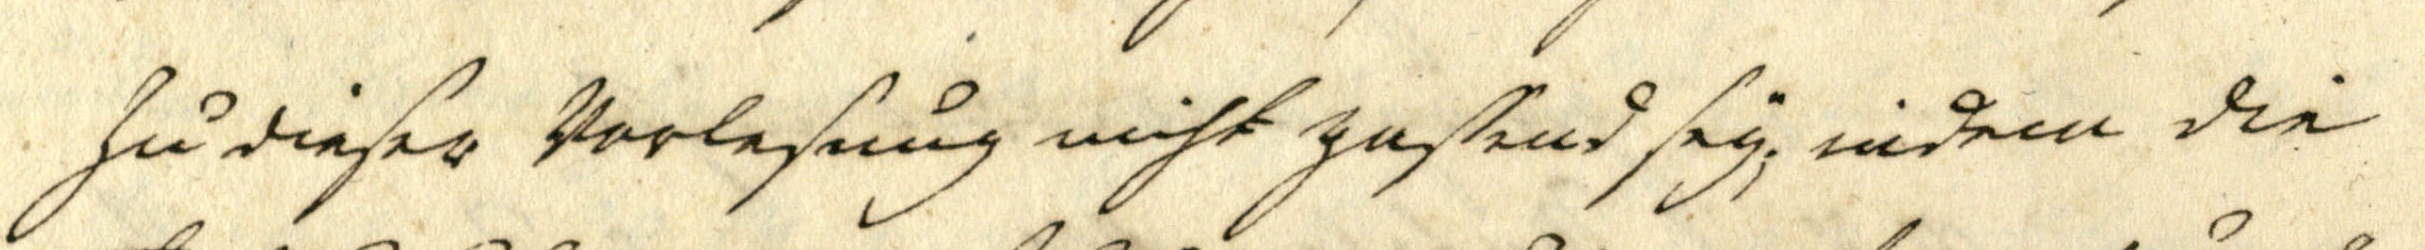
zu dieser Vorlesung nicht passend seÿ, indem die
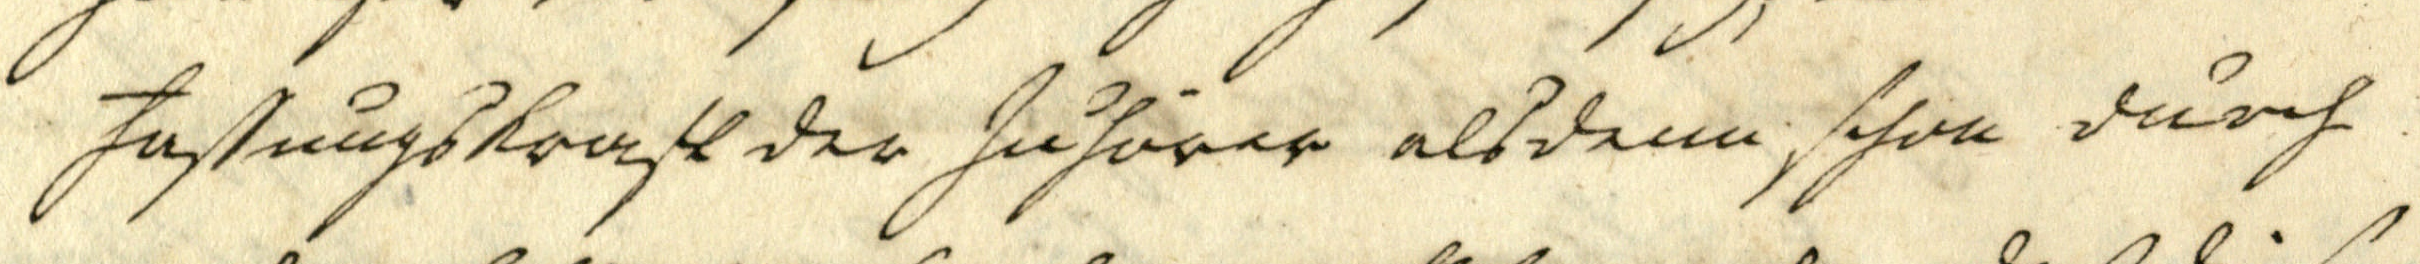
Fassungskraft der Zuhörer alsdenn schon durch
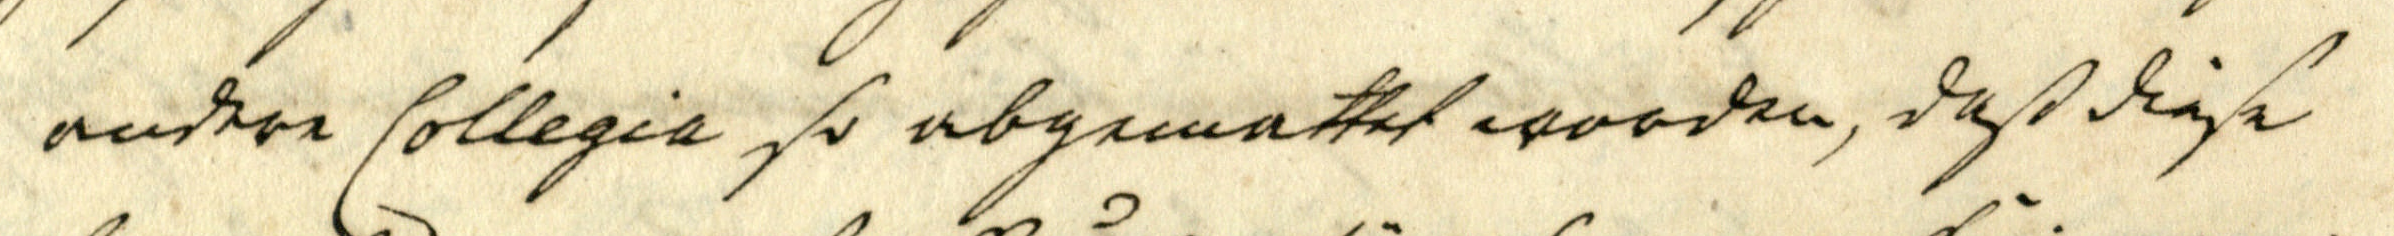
andere Collegia so abgemattet worden, daß diese
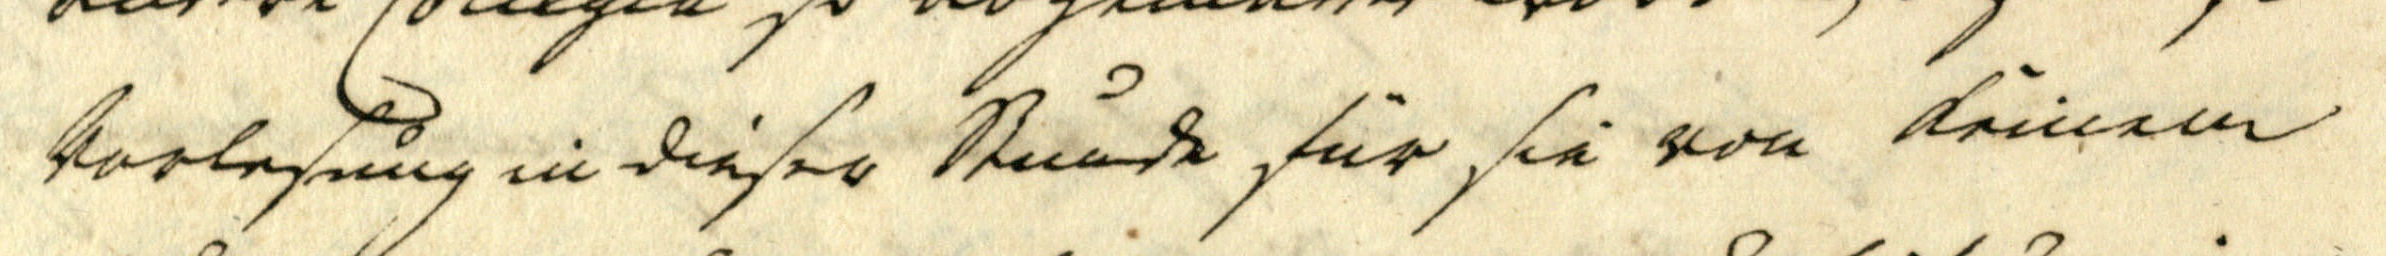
Vorlesung in dieser Stunde für sie von keinem
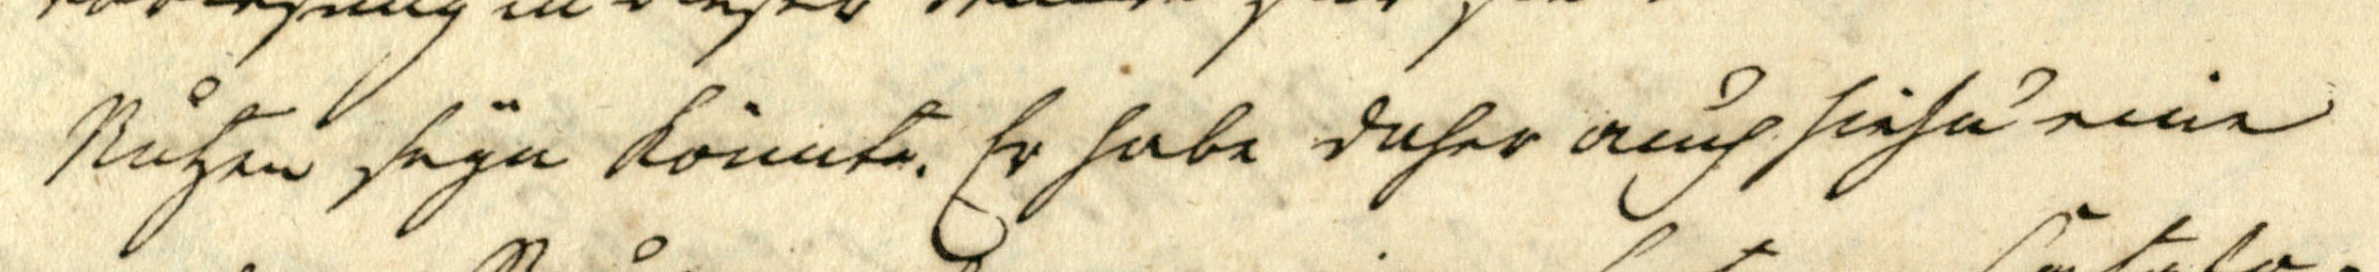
Nutzen seyn könnte. Er habe daher auch hiezu eine
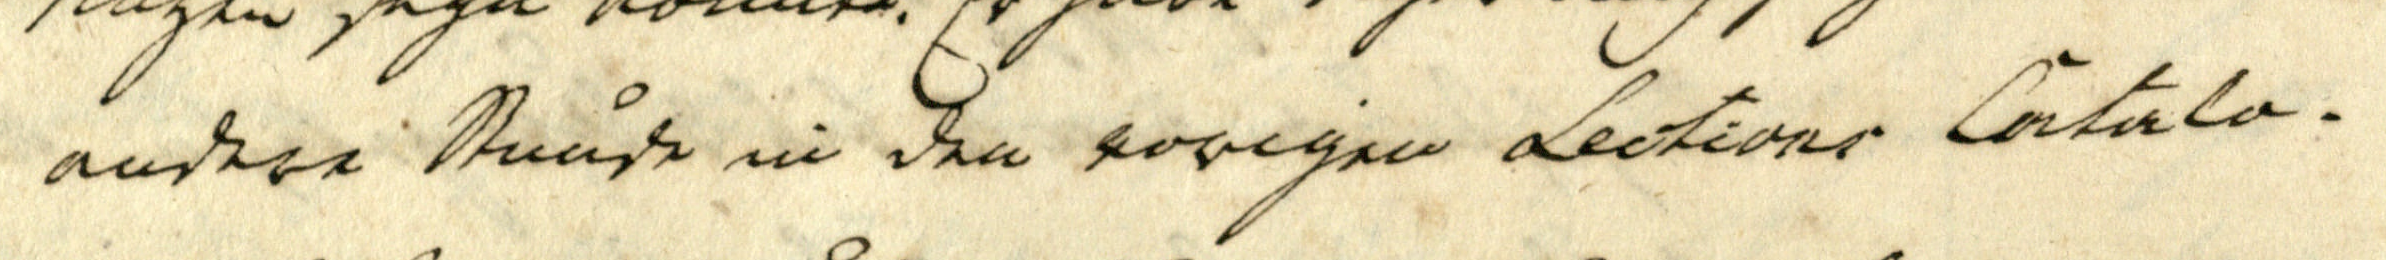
andere Stunde in den vorigen Lections Catalo¬
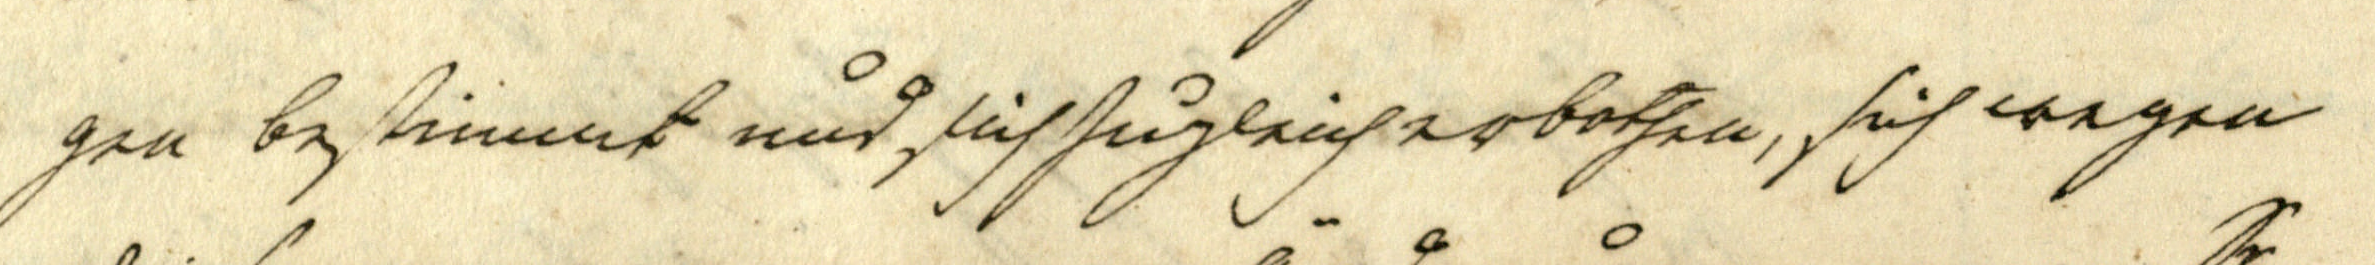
gen bestimmt und sich zugleich erbothen, sich wegen
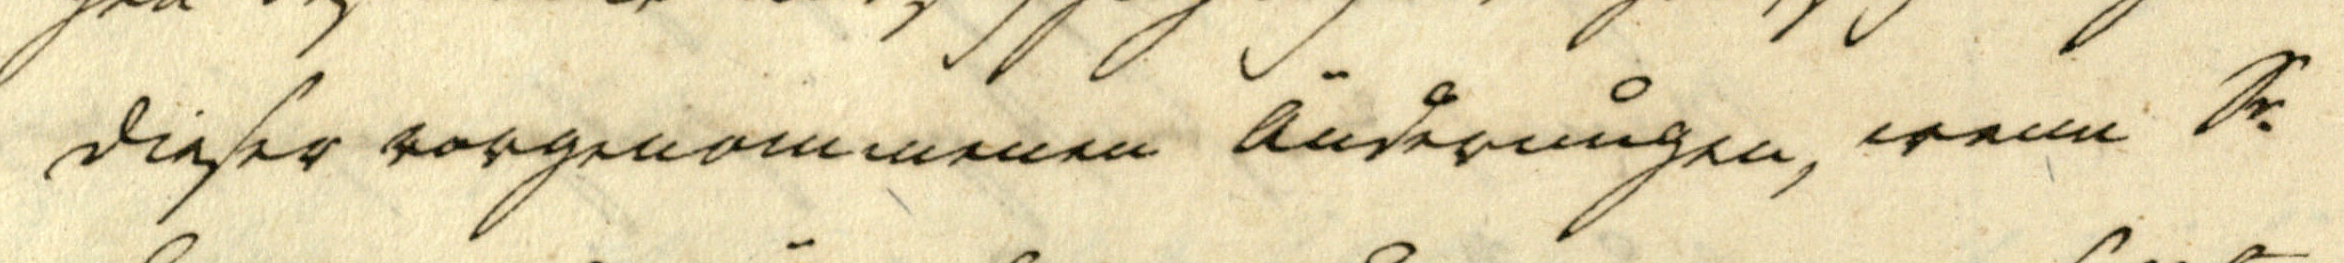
dieser vorgenommenen Änderungen, wenn Sr.
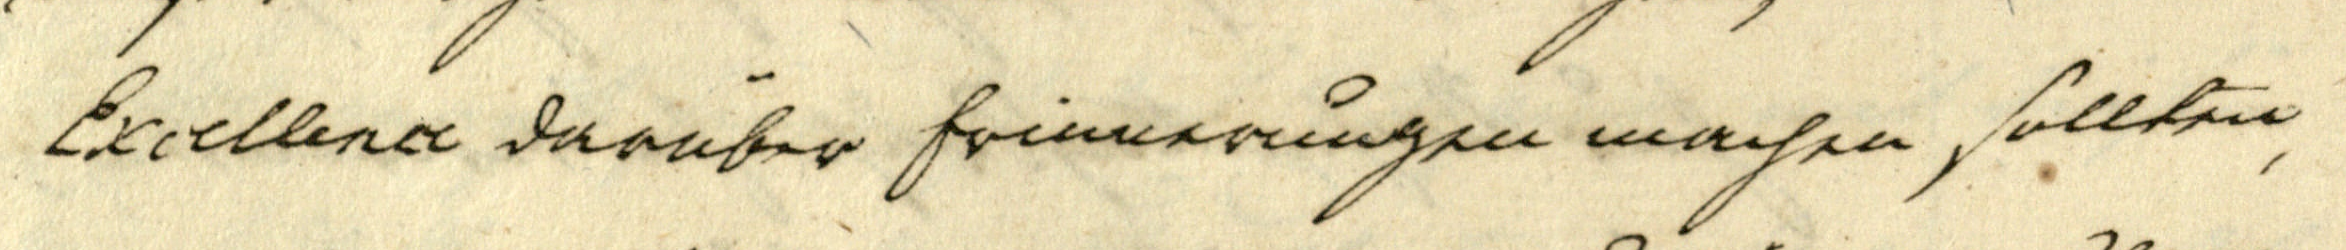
Excellence darüber Erinnerungen machen sollten,
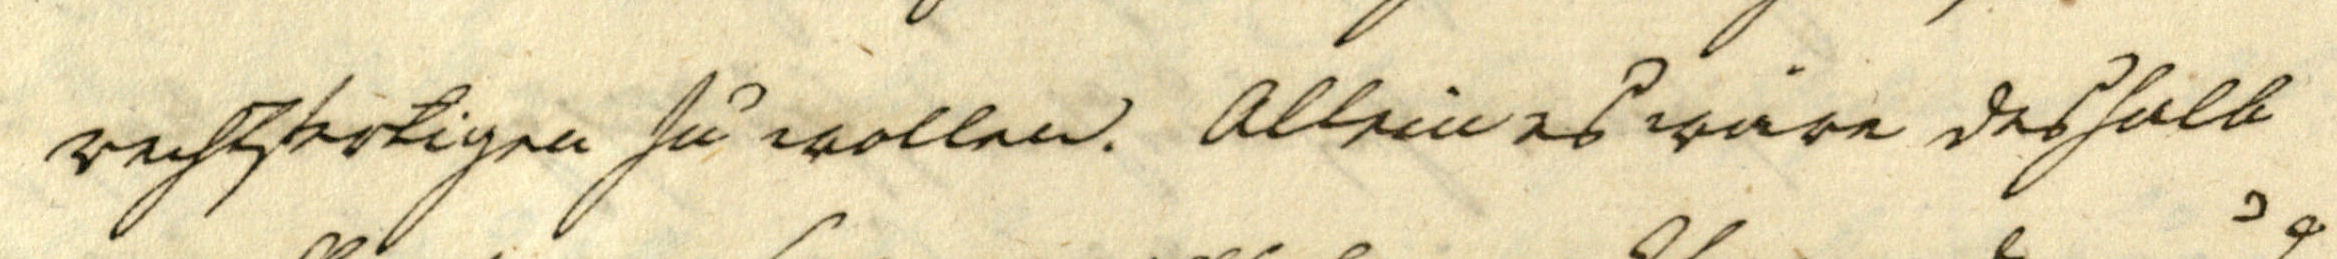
rechtfertigen zu wollen. Allein es wäre deshalb
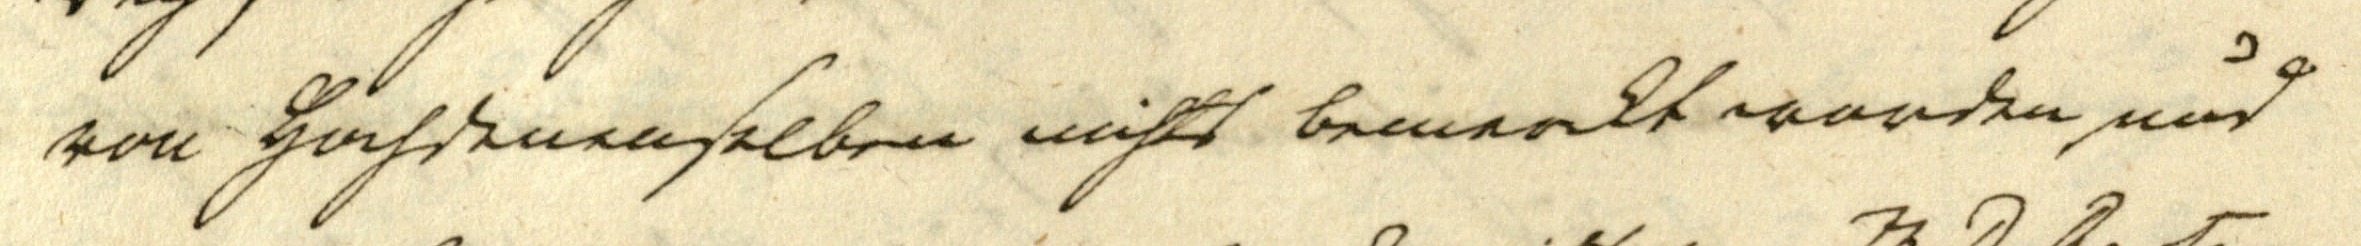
von Hochdenenselben nicht bemerckt worden und
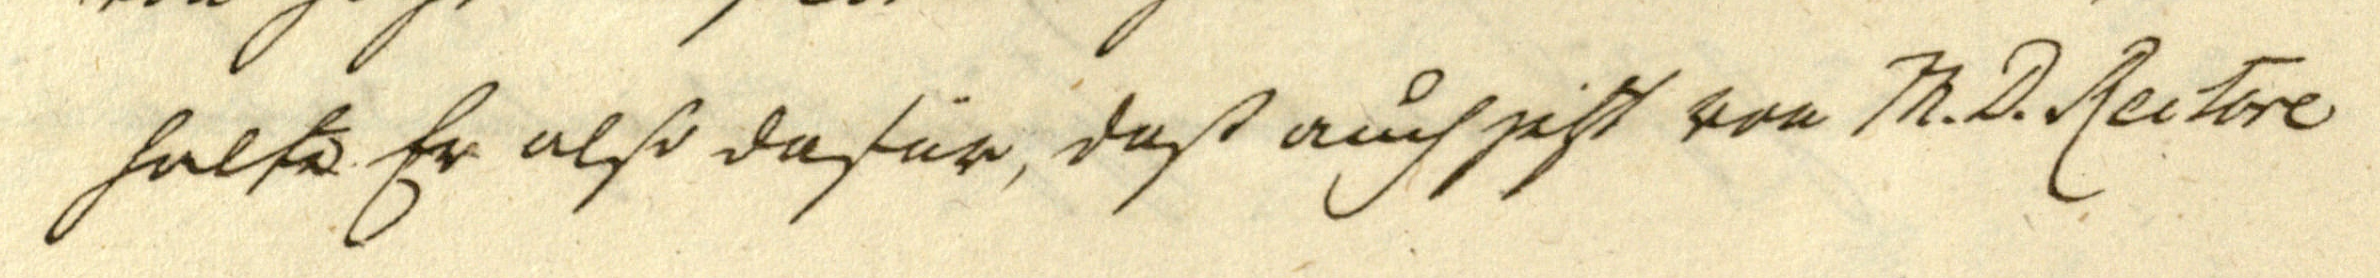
halte Er also dafür, daß auch jetzt von M. D. Rectore
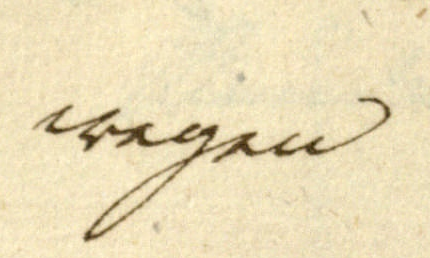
wegen
